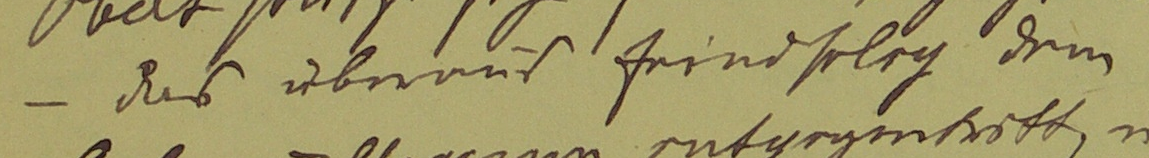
- das überaus feindselig dem
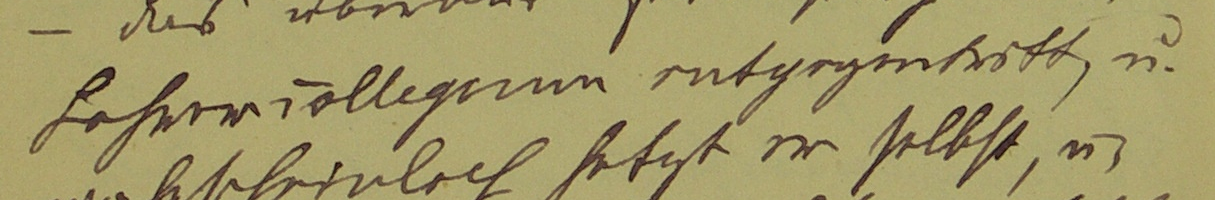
Lehrecollegium entgegentritt, u.
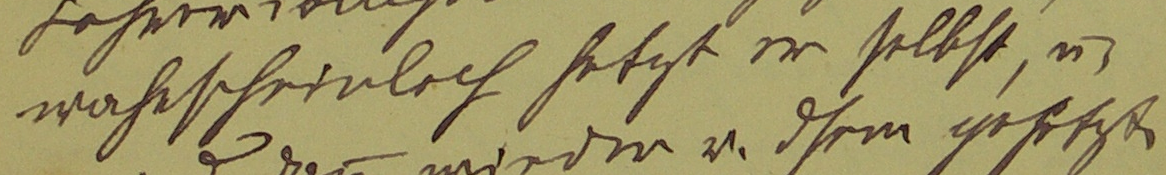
wahrscheinlich hetzt er selbst , u.
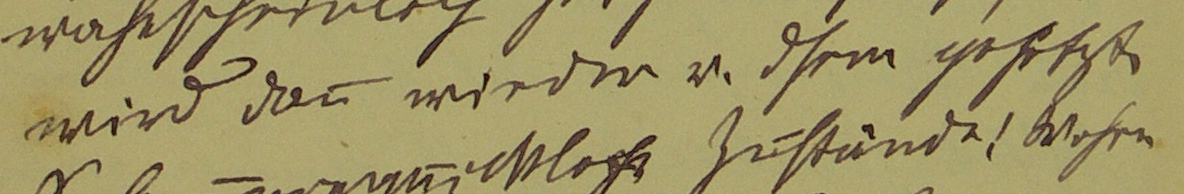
wird dann wieder v. diesem gehetzt.
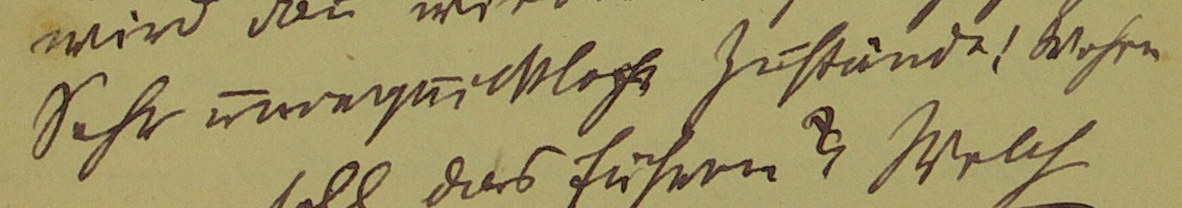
Sehr unerquickliche Zustände! Wohin
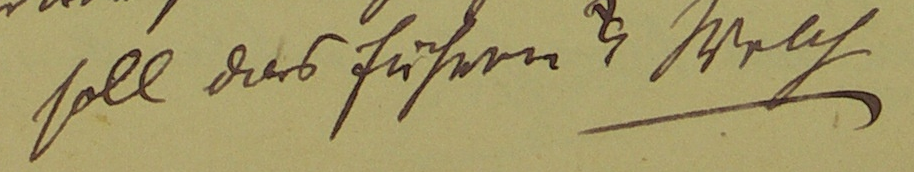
soll das führen. Welch
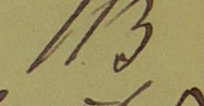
113
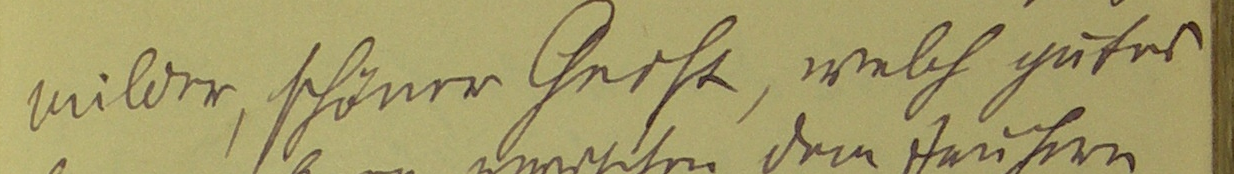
milder, schöner Geist, welch gutes
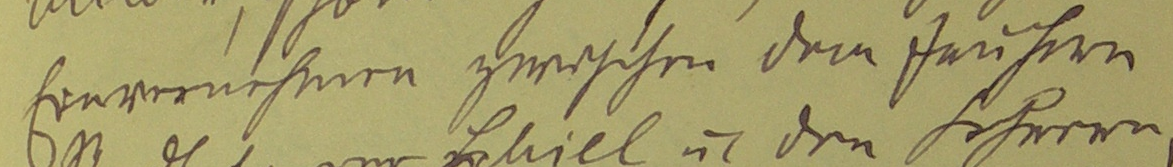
Einvernehmen zwischen dem früheren
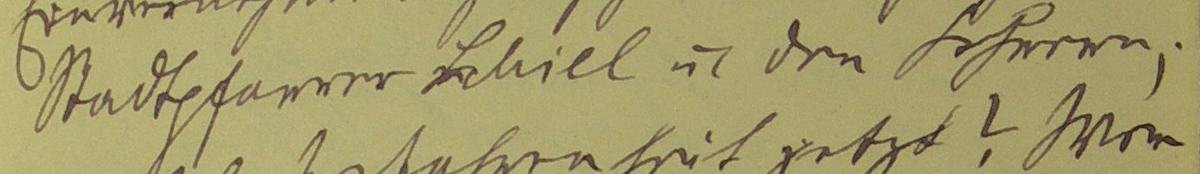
Stadtpfarrer Schiel und den Lehrern,
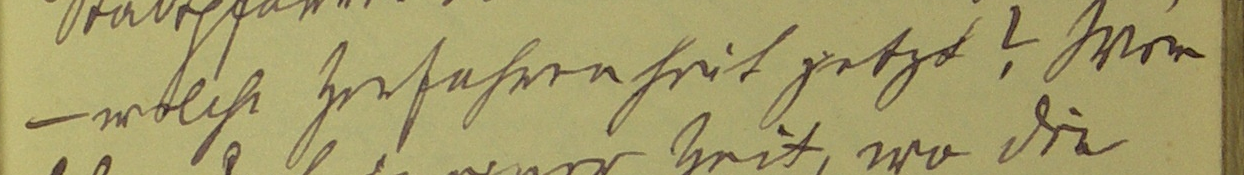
- Welche Zerfahrenheit jetzt ?, -Wir
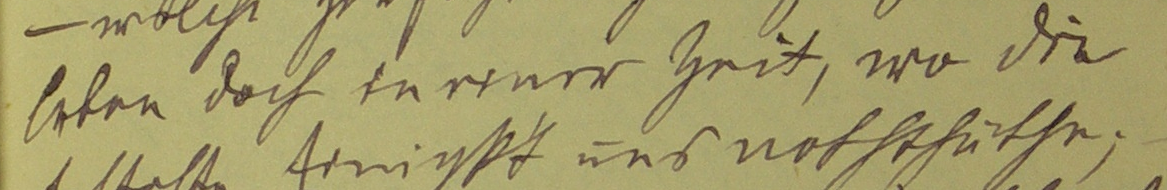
leben doch in einer Zeit, wo die
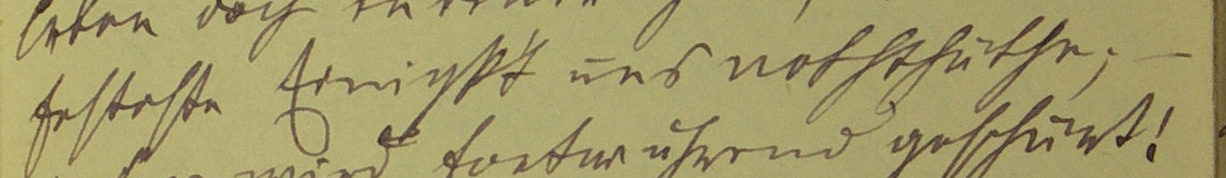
festeste Einigkeit uns noththäthe; -
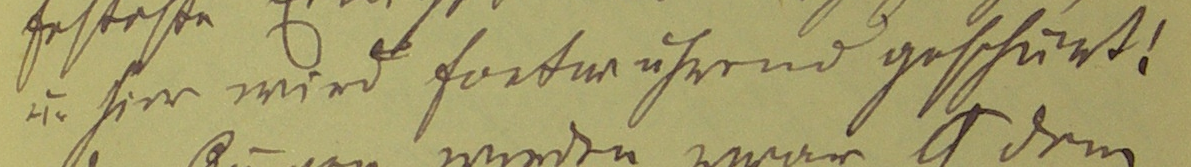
u. hier wird fortwährend geschürt!
